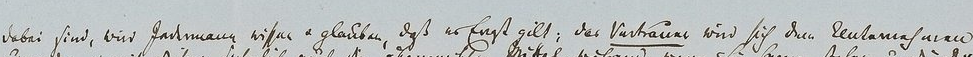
dabei sind, wird Jedermann wissen & glauben, daß es Ernst gilt; das Vertrauen wird sich dem Unternehmen
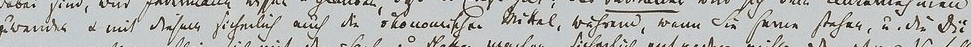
zuwenden & mit diesem sicherlich auch die ökonomischen Mittel, während, wenn Sie ferne stehen, u. die Dii
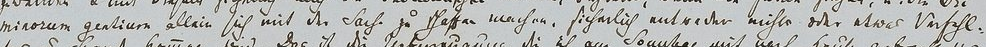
minorum gentium allein sich mit der Sache zu schaffen machen, sicherlich entweder nichts oder etwas Verfehl-
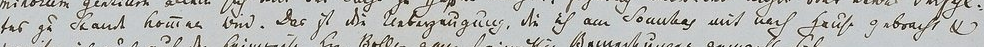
tes zu Stande kommen wird. Das ist die Ueberzeugung, die ich am Sonntag mit nach Hause gebracht &
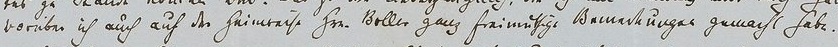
worüber ich auch auf der Heimreise Hrn. Boller ganz freimüthige Bemerkungen gemacht habe.
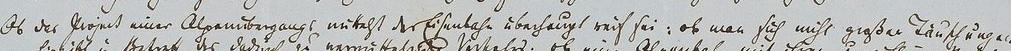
Ob das Project eines Alpenübergangs mittelst der Eisenbahn überhaupt reif sei; ob man sich nicht großen Täuschungen
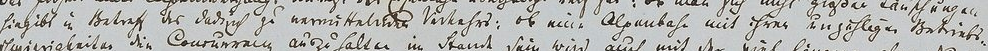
hingibt in Betreff des dadurch zu vermittelnden Verkehrs; ob eine Alpenbahn mit ihren unzähligen Betriebs-
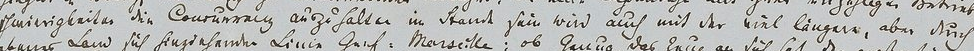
schwierigkeiten die Concurrenz auszuhalten im Stande sein wird auch mit der viel längern, aber durch
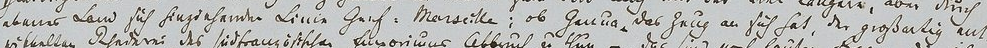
ebenes Land sich hinziehenden Linie Genf–Marseille ob Genua das Zeug an sich hat, der großartig ent-
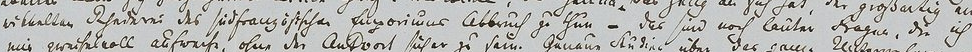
wikkelten Rhederei des südfranzösischen Emporiums Abbruch zu thun – das sind noch lauter Fragen, die ich
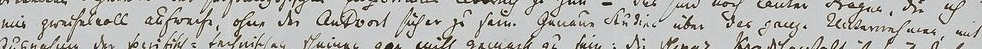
mir zweifelvoll aufwerfe, ohne der Antwort sicher zu sein. Genaue Studien über das ganze Unternehmen, mit
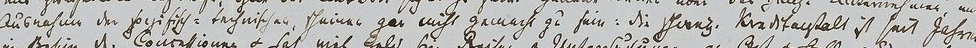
Ausnahme der spezifisch-technischen, scheinen gar nicht gemacht zu sein: die schweiz. Kreditanstalt ist seit Jahren
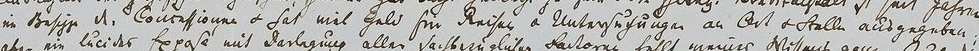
im Besizze d. Concessionen & hat viel Geld für Reisen & Untersuchungen an Ort & Stelle ausgegeben;
